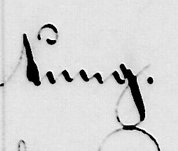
tung.
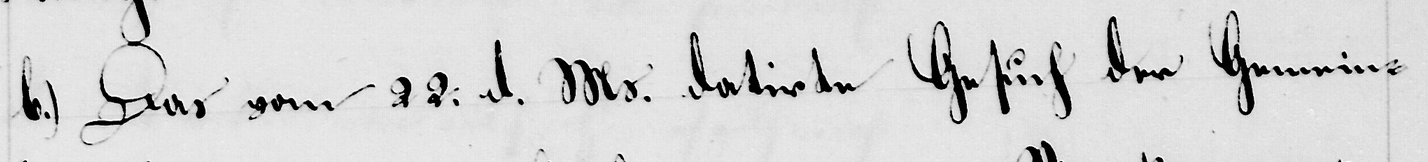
b.) Das vom 22. d. Ms. datirte Gesuch der Gemein¬
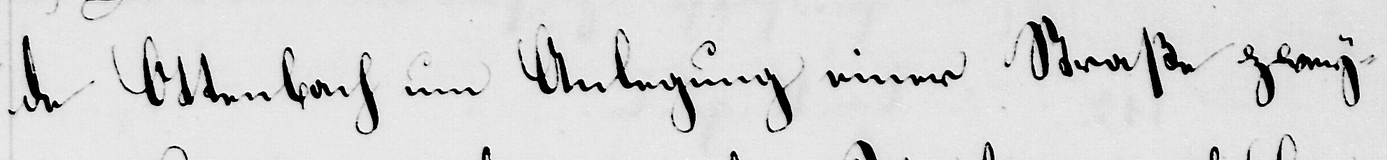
de Ottenbach um Anlegung einer Straße zwey¬
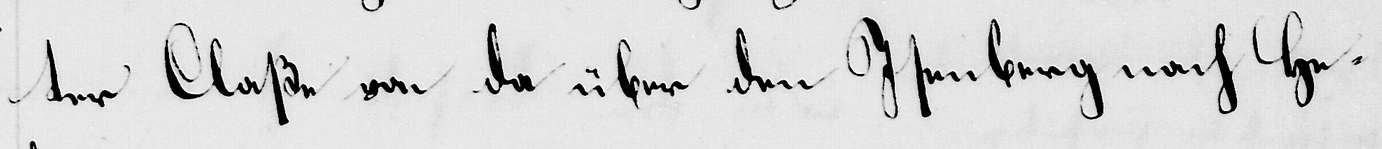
ter Claße von da über den Isenberg nach He¬
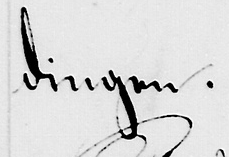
dingen.
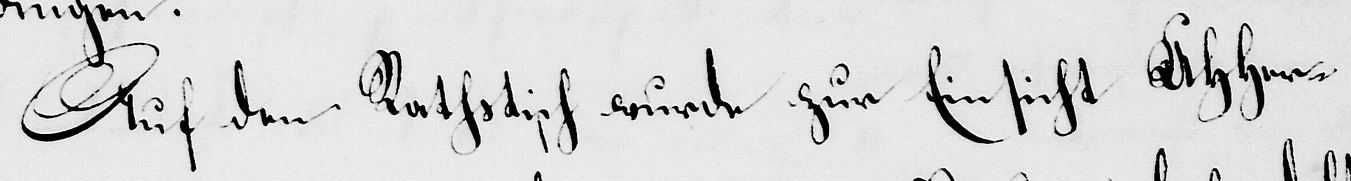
Auf den Rathstisch wurde zur Einsicht UHHer¬
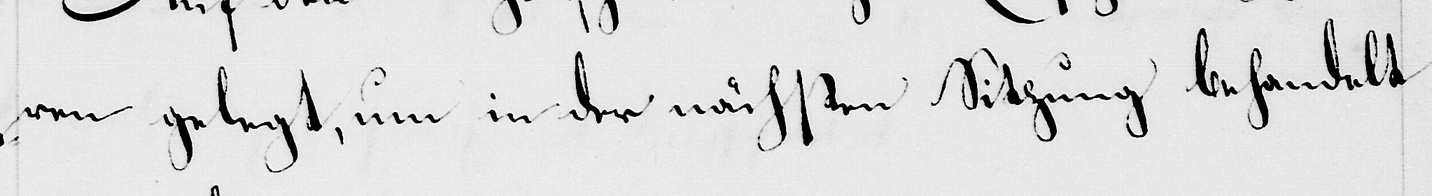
ren gelegt, um in der nächsten Sitzung behandelt
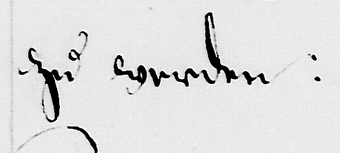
zu werden:
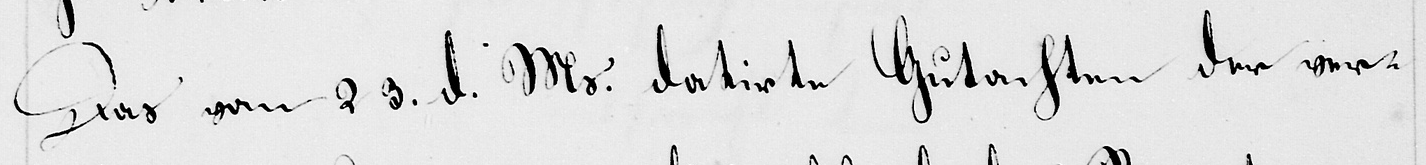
Das vom 23. d. Ms. datirte Gutachten der ver¬
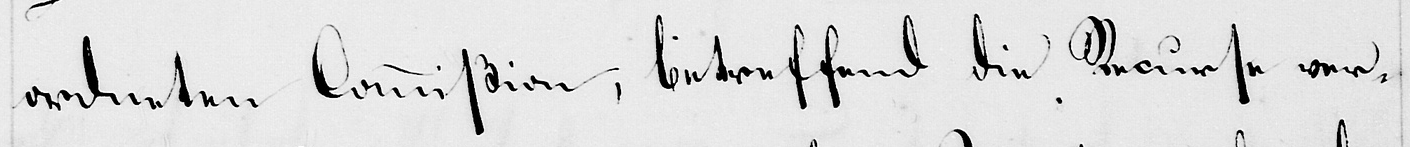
ordneten Commißion, betreffend die Recurse ver¬
